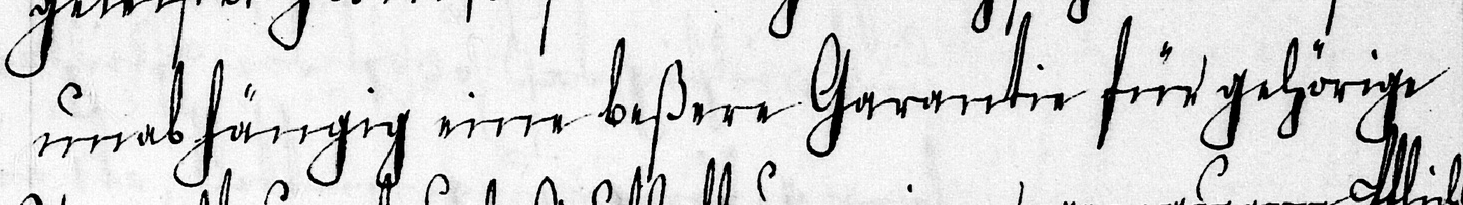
unabhängig eine beßere Garantie für gehörige
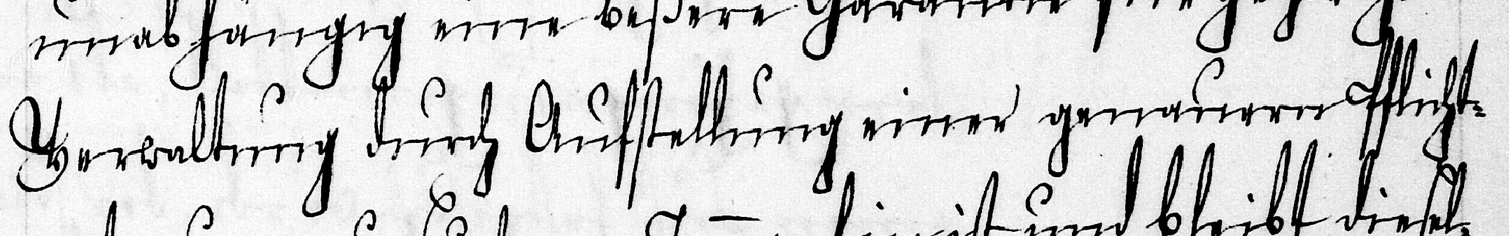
Verwaltung durch Aufstellung einer genauern Pflicht¬
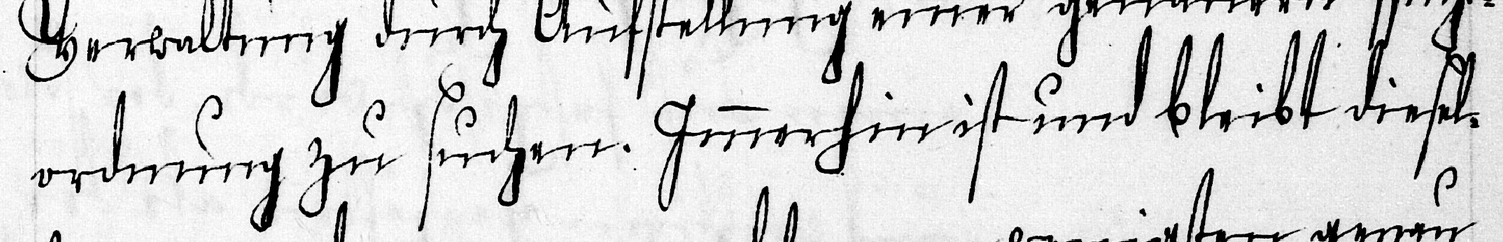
ordnung zu suchen. Immerhin ist und bleibt diesel¬
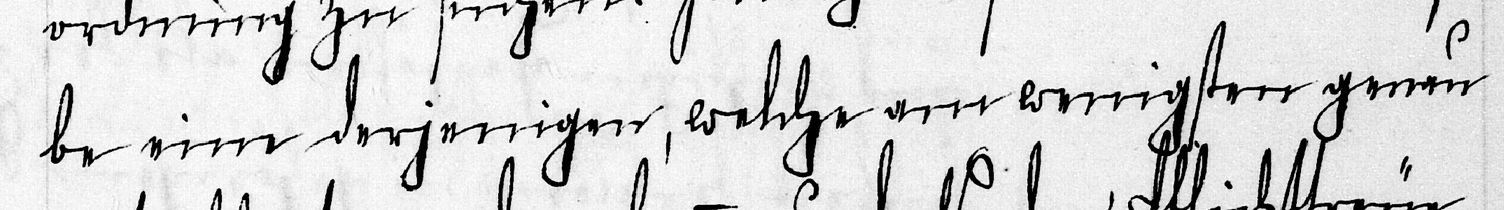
be eine derjenigen, welche am wenigsten genau
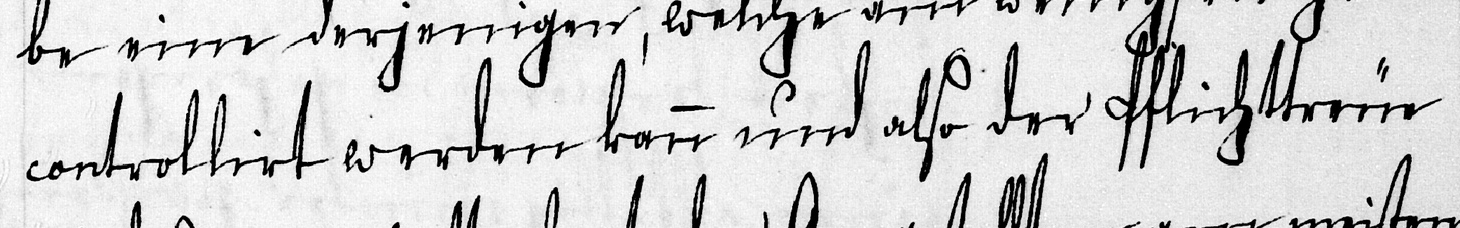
controllirt werden kann und also der Pflichttreue
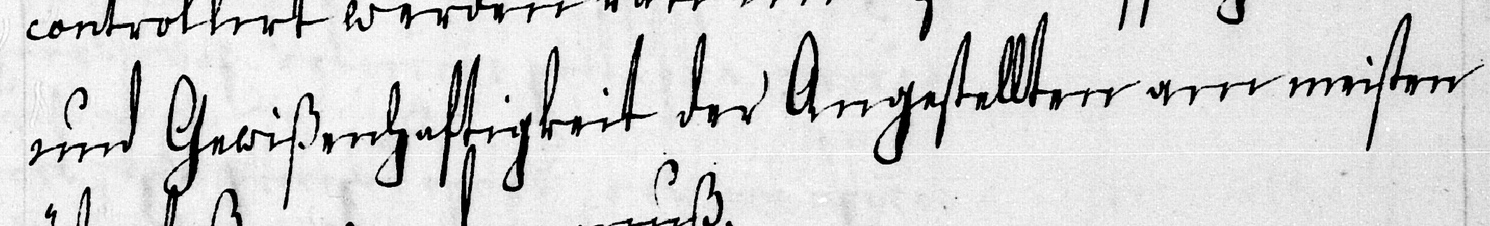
und Gewißenhaftigkeit der Angestellten am meisten
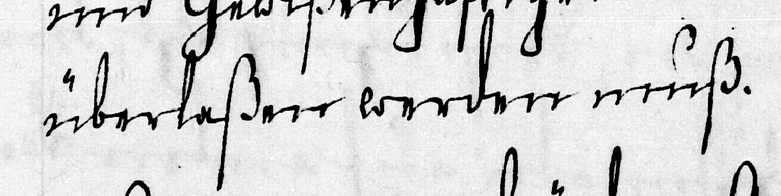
überlaßen werden muß.
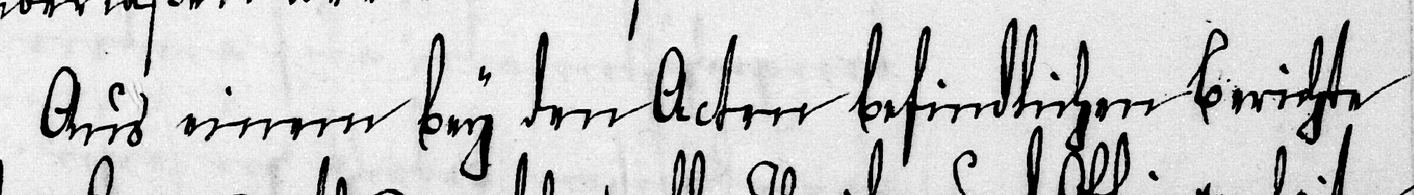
Aus einem bey den Acten befindlichen Berichte
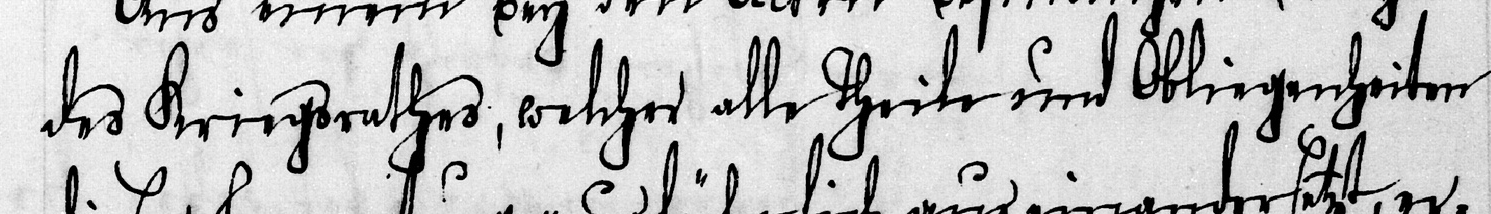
des Kriegsrathes, welcher alle Theile und Obliegenheiten
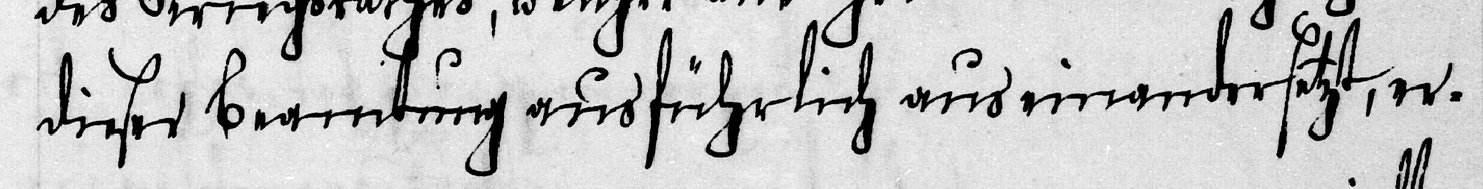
dieser Beamtung ausführlich auseinandersetzt, er-
